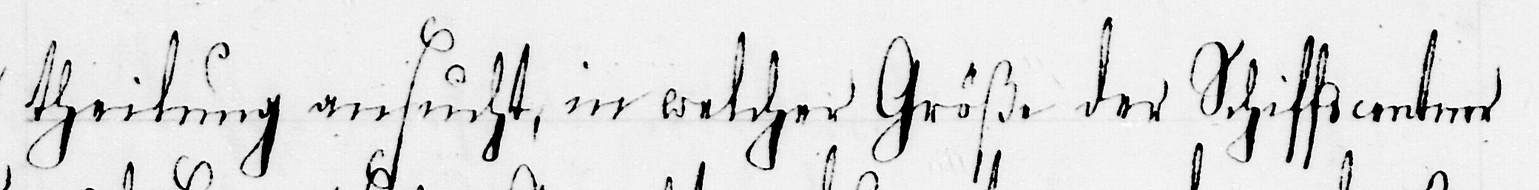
theilung ansucht, in welcher Größe der Schiffscentn¬
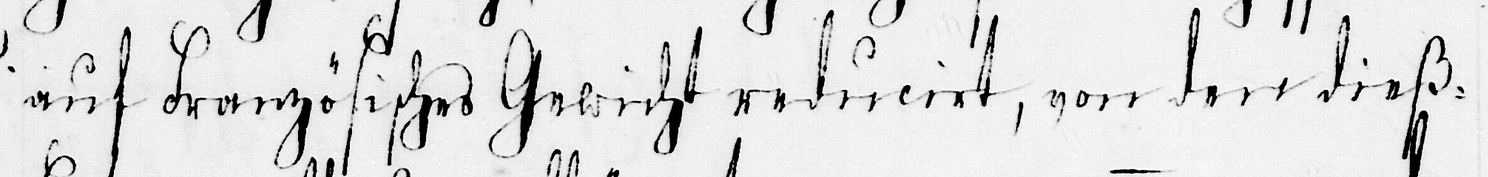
auf Französisches Gewicht reducirt, von den dieß¬
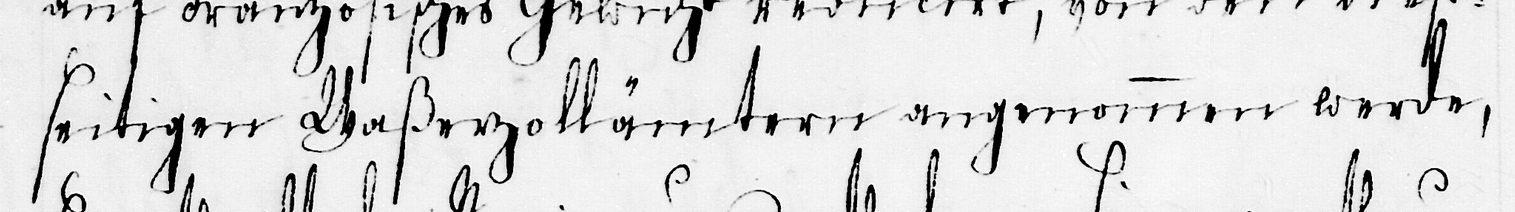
seitigen Waßerzollämtern angenommen werde,
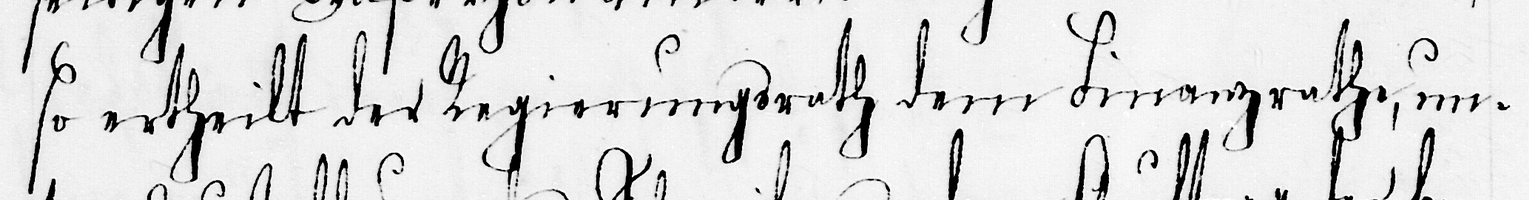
so ertheilt der Regierungsrath dem Finanzrathe, un¬
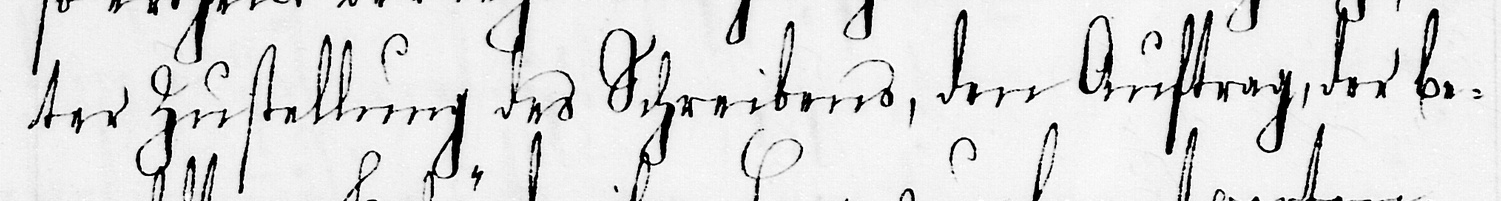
ter Zustellung des Schreibens, den Auftrag, der be¬
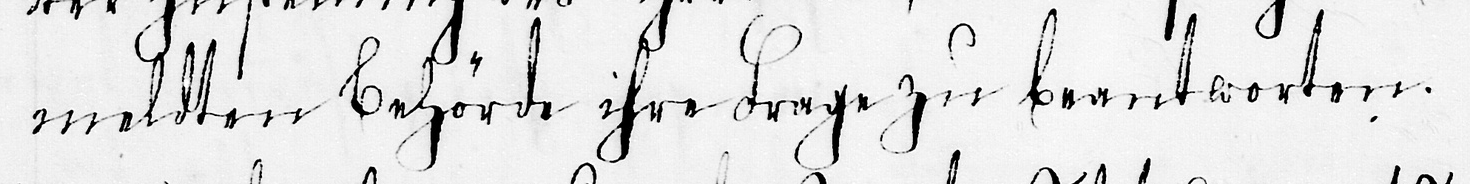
meldten Behörde ihre Frage zu beantworten.
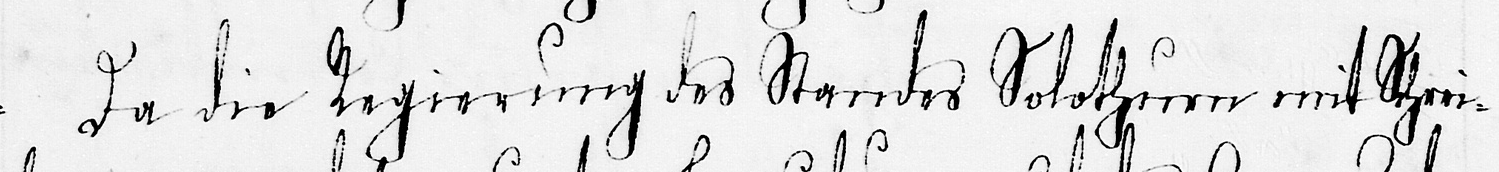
Da die Regierung des Standes Solothurn mit Schrei¬
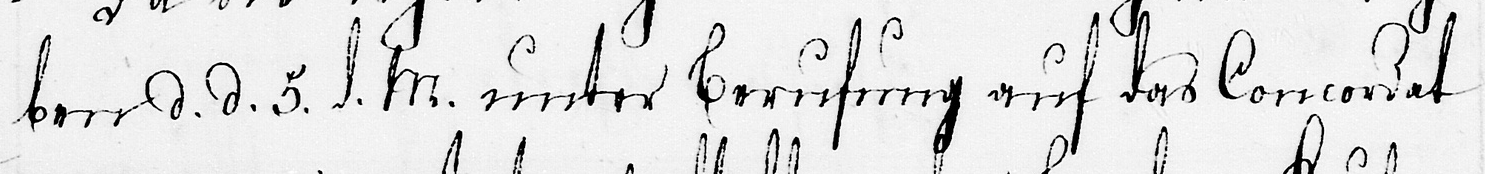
ben d. d. 5. d. M. unter Berufung auf das Concordat
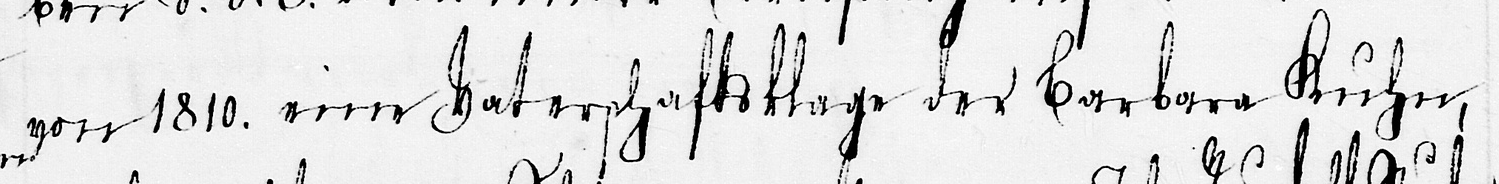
von 1810. eine Vaterschaftsklage der Barbara Kuhn,
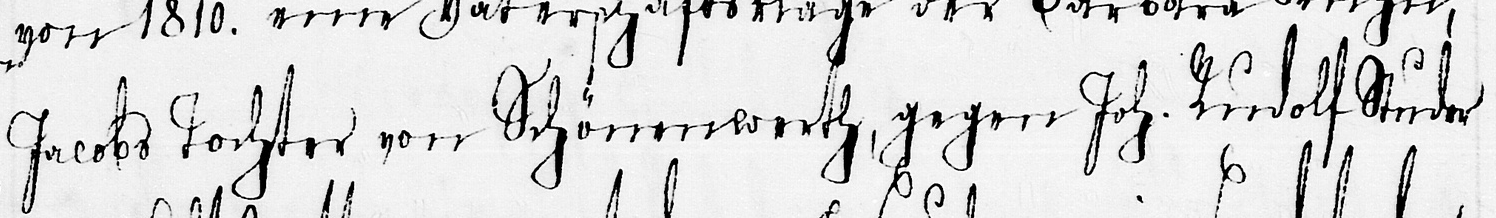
Jacobs Tochter von Schönenwerth, gegen Joh. Rudolf Studer
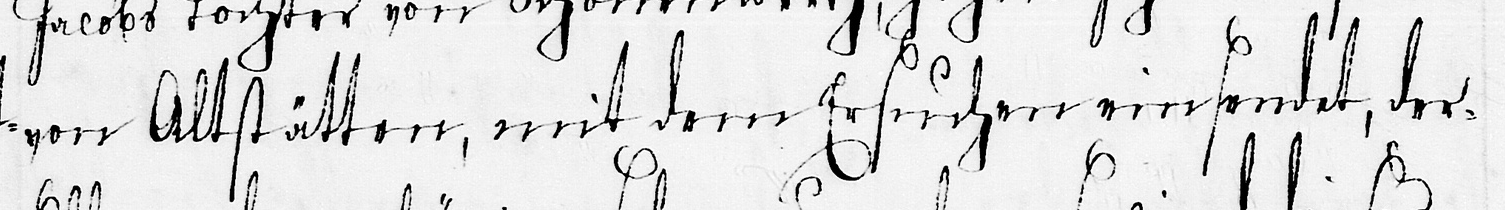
von Altstätten, mit dem Ersuchen einsendet, der¬
